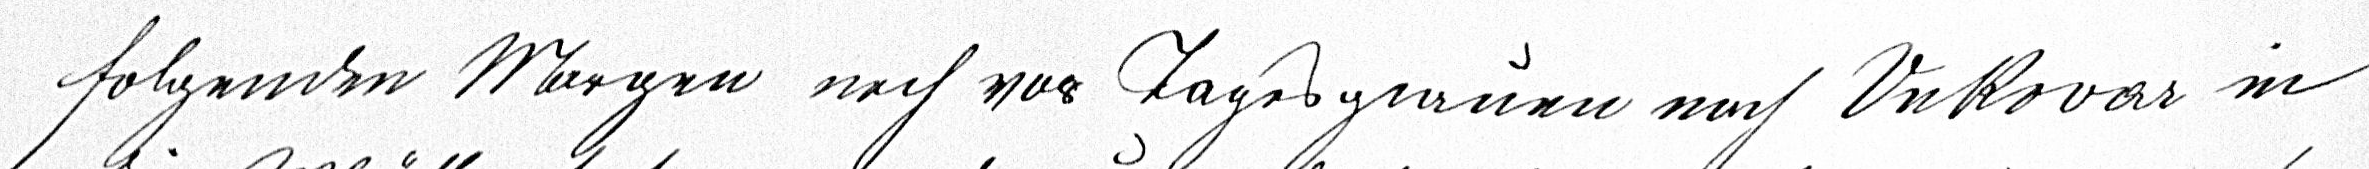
folgenden Morgen nach vor Tagesgrauen nach Vukovar in
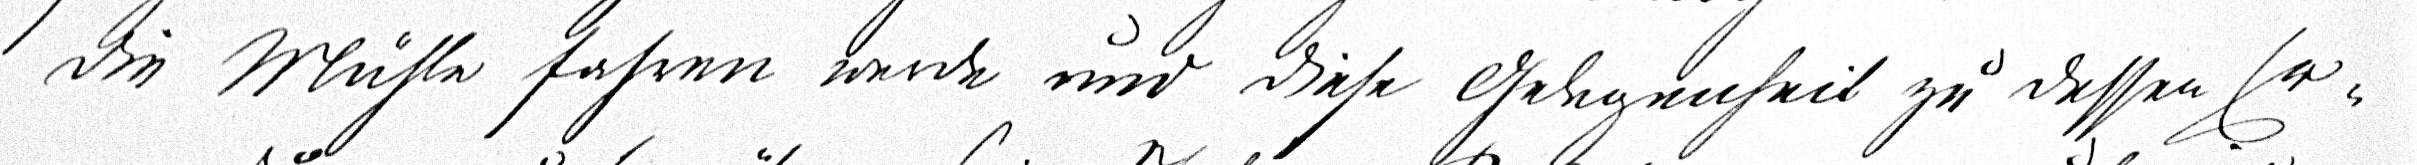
die Mühle fahren werde und diese Gelegenheit zu dessen Er¬
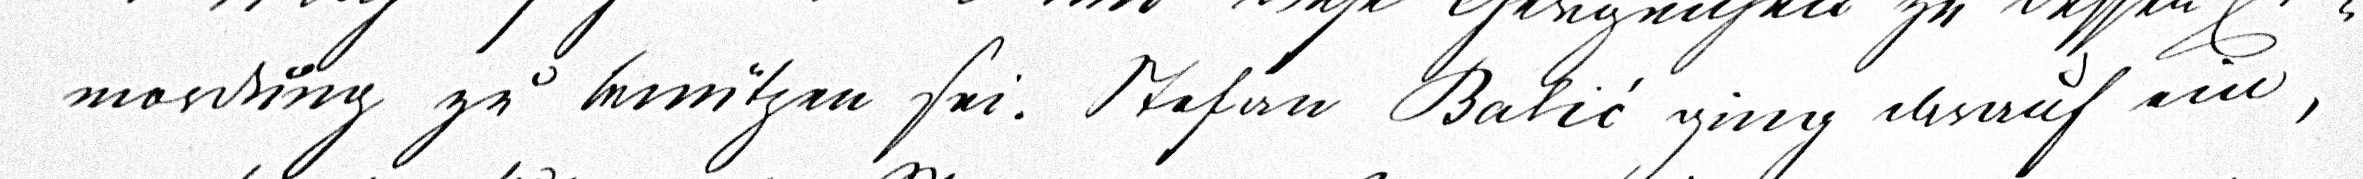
mordung zu benützen sei. Stefan Balić ging drauf ein,
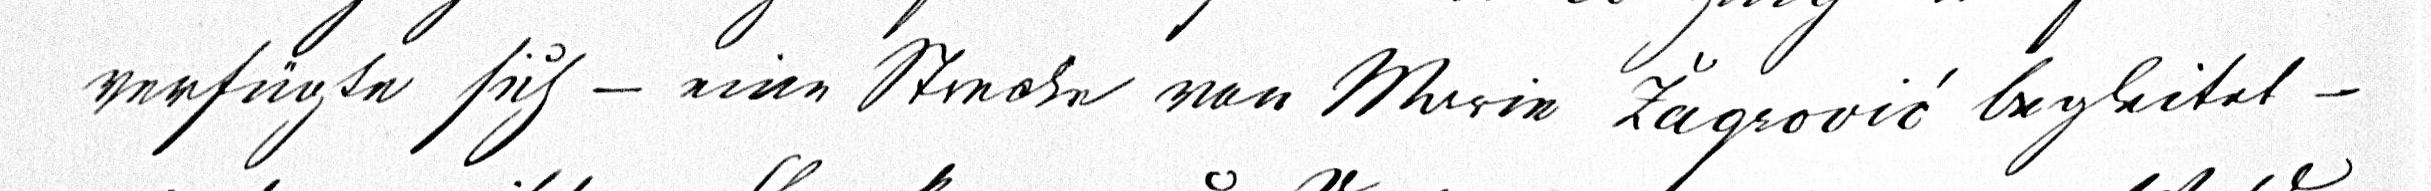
verfügte sich - eine Strecke von Marie Zagrović begleitet -
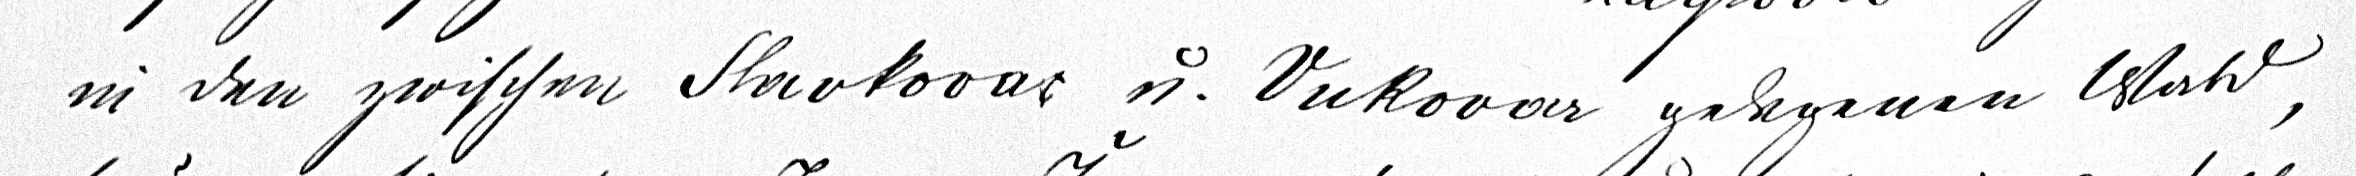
in den zwischen Slavkovac u. Vukovar gelegenen Wald,
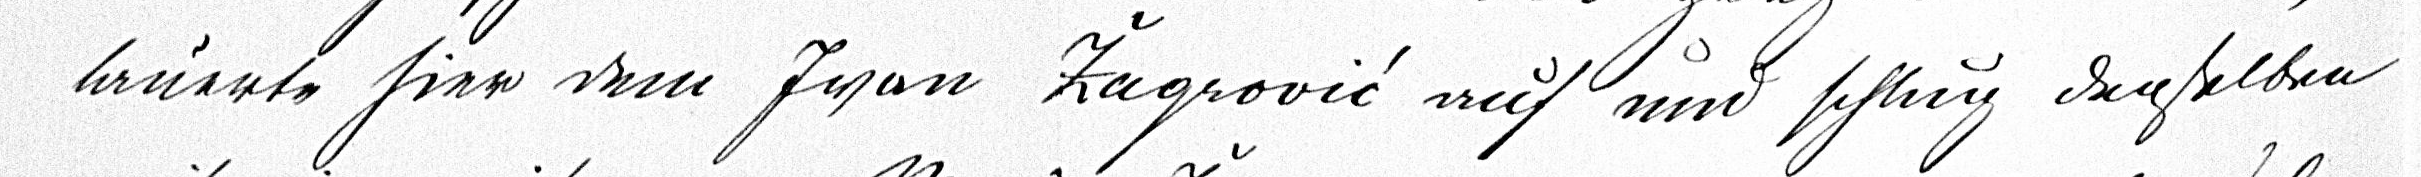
lauerte hier dem Ivan Zagrović auf und schlug derselben
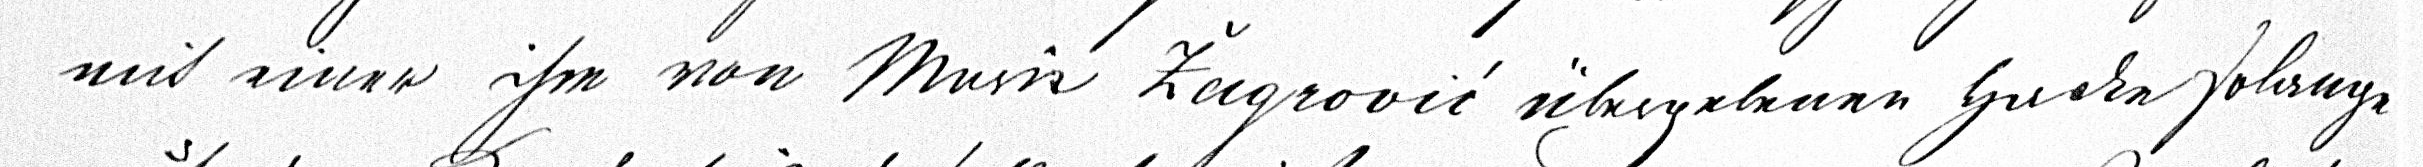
mit einer ihm von Marie Zagrović übergebenen Hacke solange
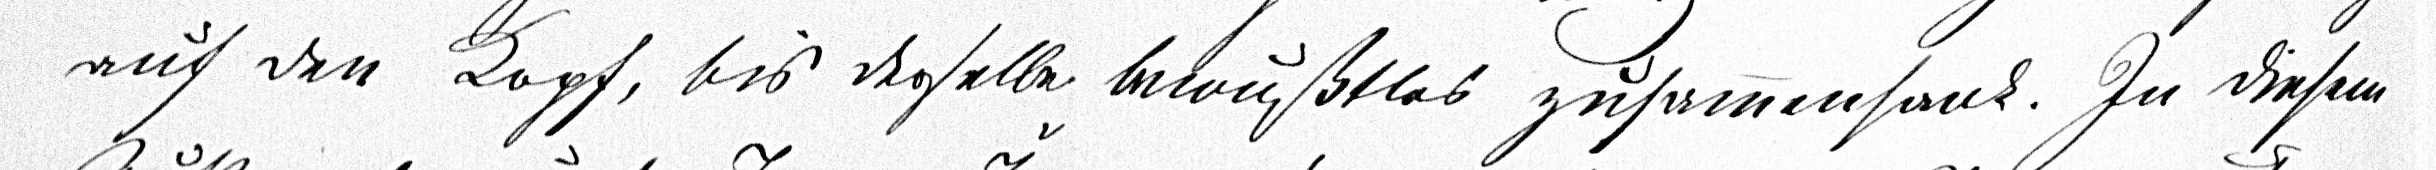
auf den Kopf, bis derselbe bewußtlos zusammensank. In diesem
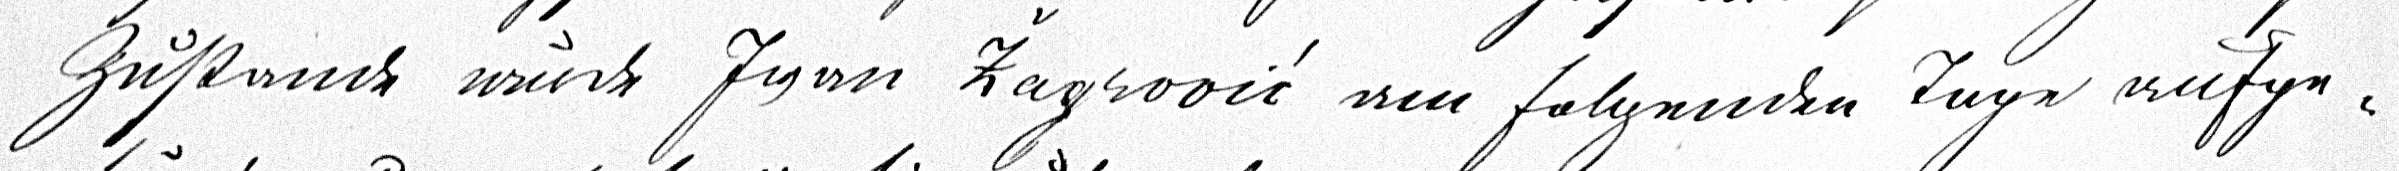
Zustande wurde Ivan Zagrović am folgenden Tage aufge¬
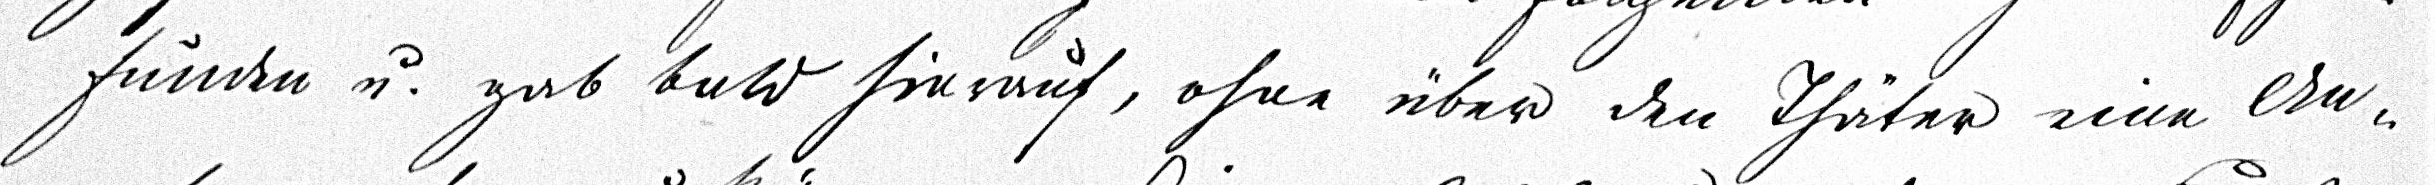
funden u. gab bald hierauf, ohne über den Thäter eine An¬
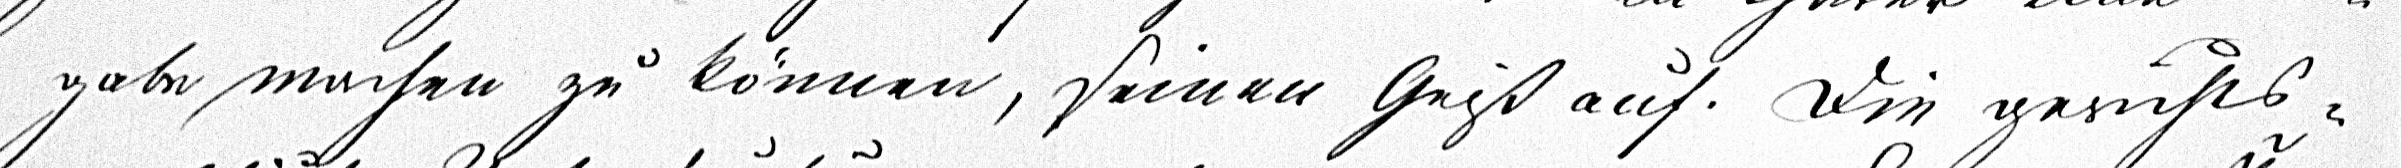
gabe machen zu können, seinen Geist auf. Die gerichts¬
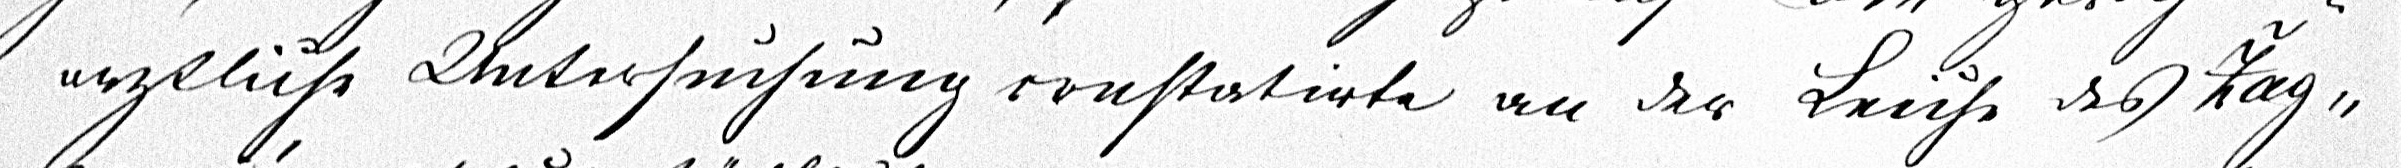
arztliche Untersuchung constatirte an der Leiche des Zag¬
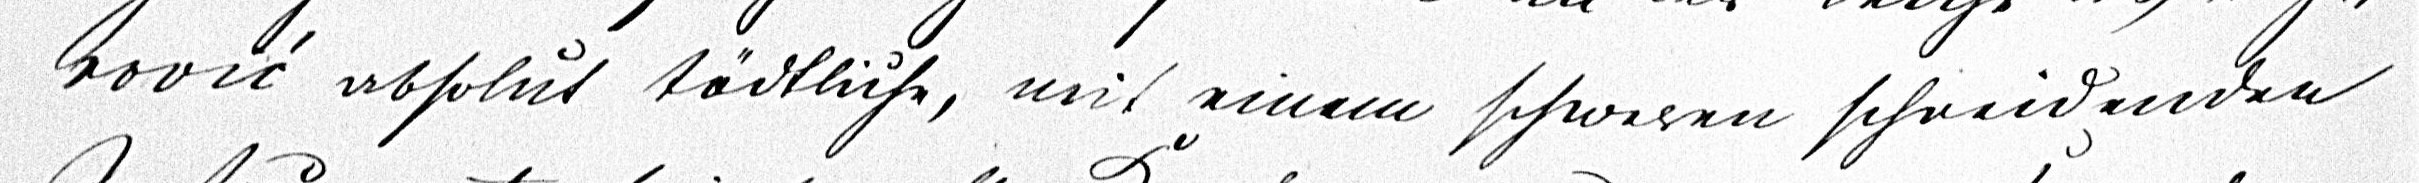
rović absolut tödtliche, mit einem schweren schneidenden
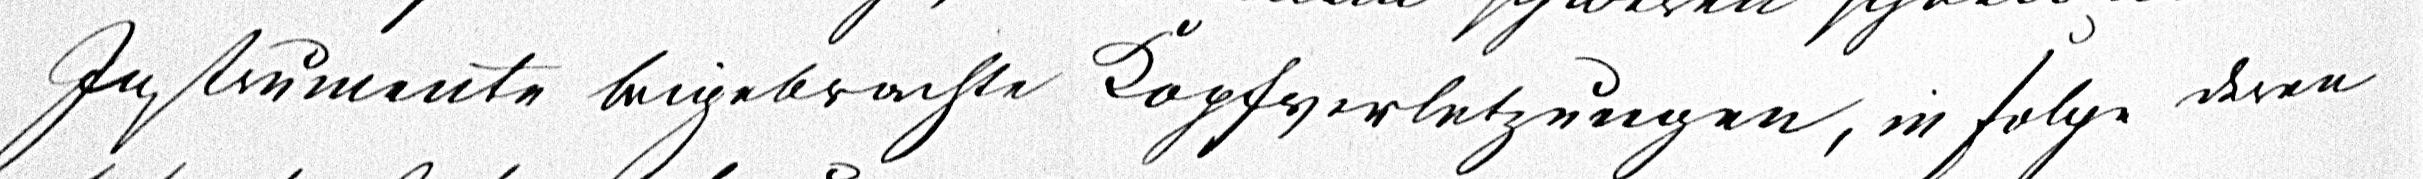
Instrumente beigebrachte Kopfverletzungen, in folge deren
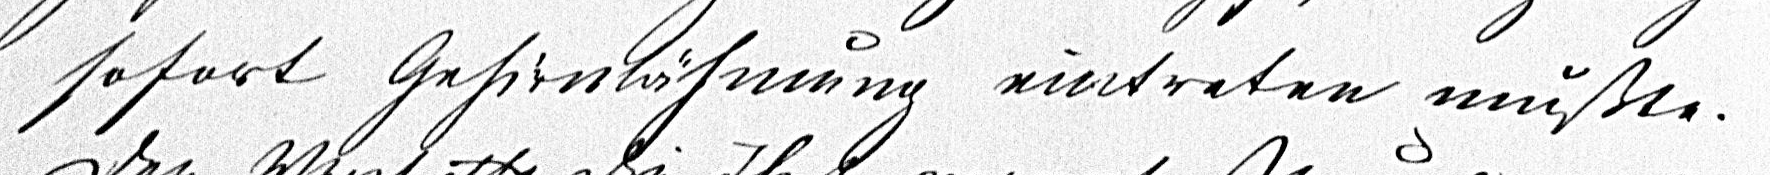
sofort Gehirnlähmung eintreten mußte.
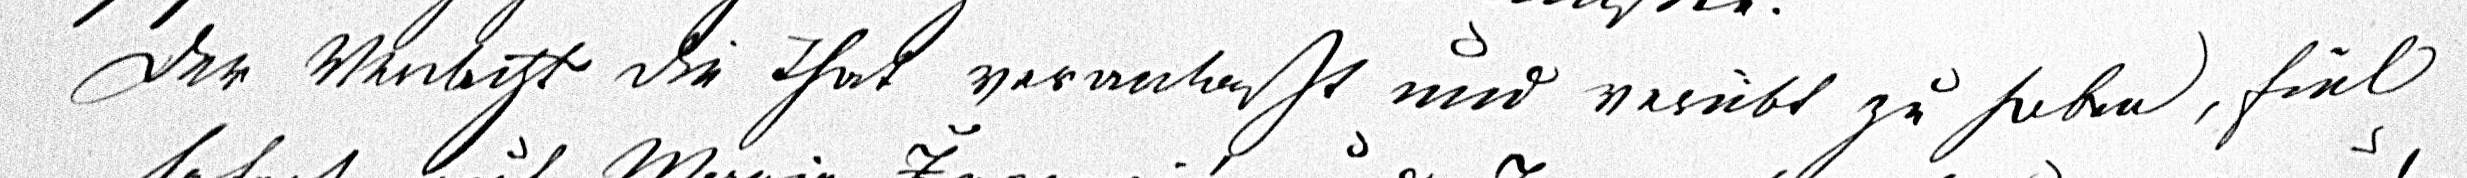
Der Verleiht die That veranlaßt und verübt zu haben, fiel
